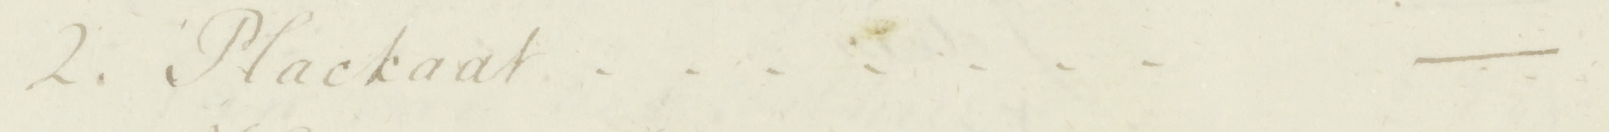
2. Plackaat.......—
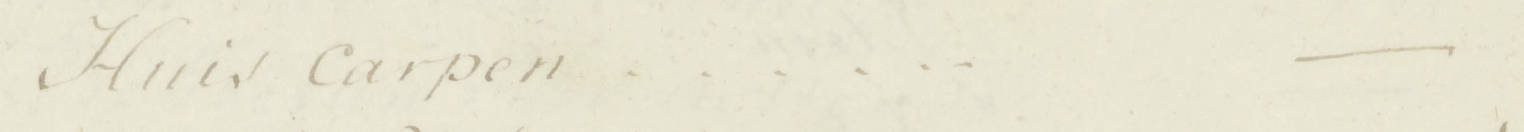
Huis Carpen ......—
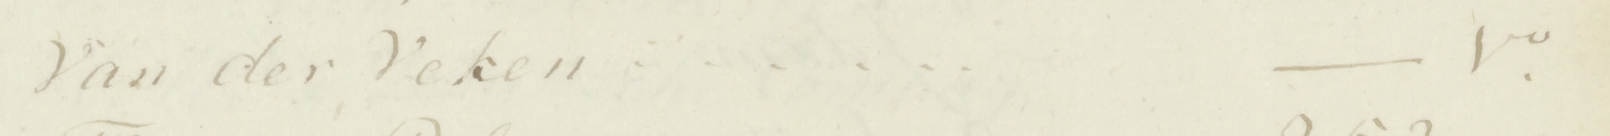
Van der Veken......— Vo.
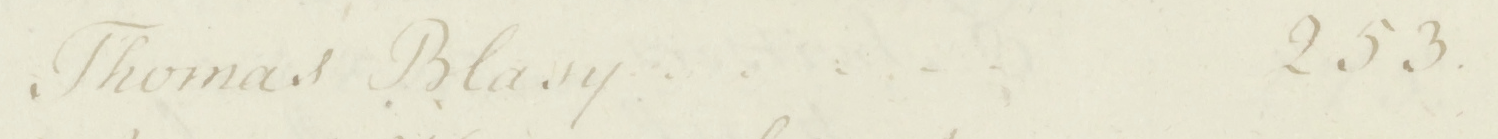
Thomas Blasy.....253.
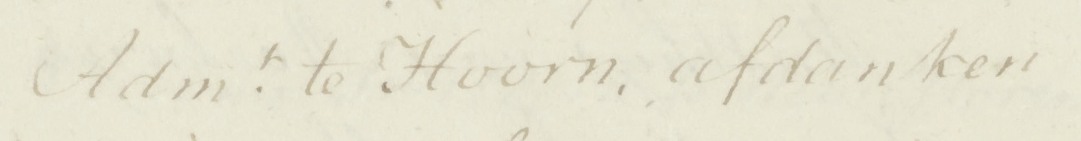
Admt. te Hoorn, afdanken
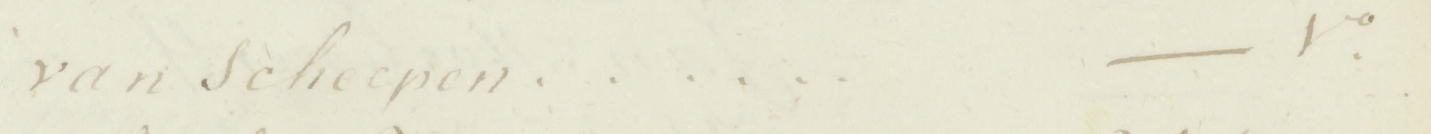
van Scheepen......Vo.
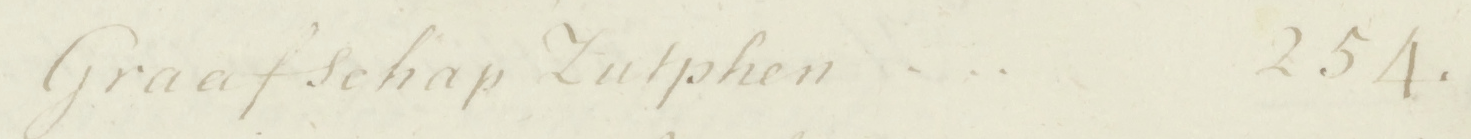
Graafschap Zutphen...254.
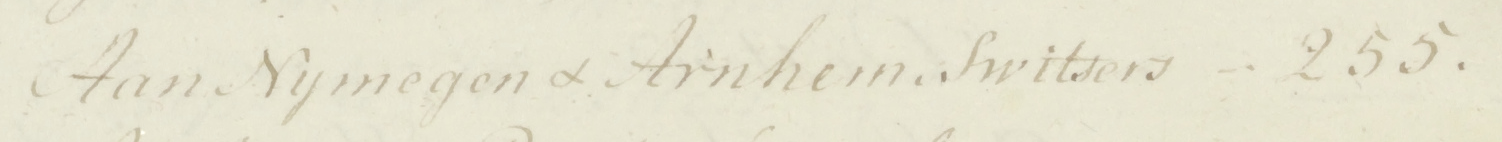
Aan Nymegen & Arnhem Switsers..255.
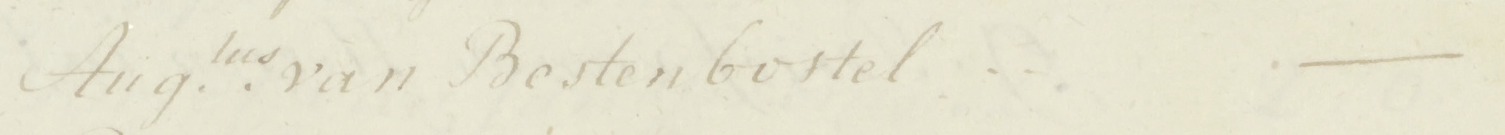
Augtus van Bestenbestel..—
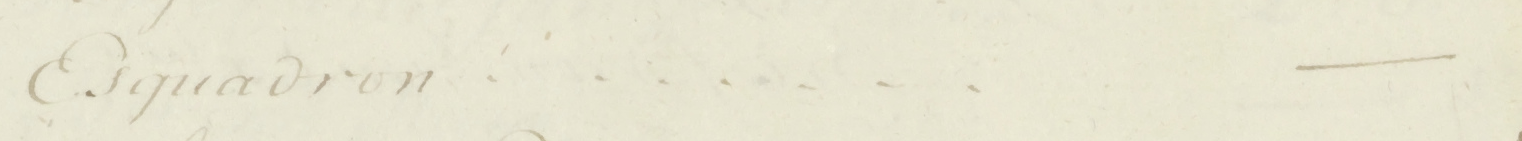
Esquadron......—
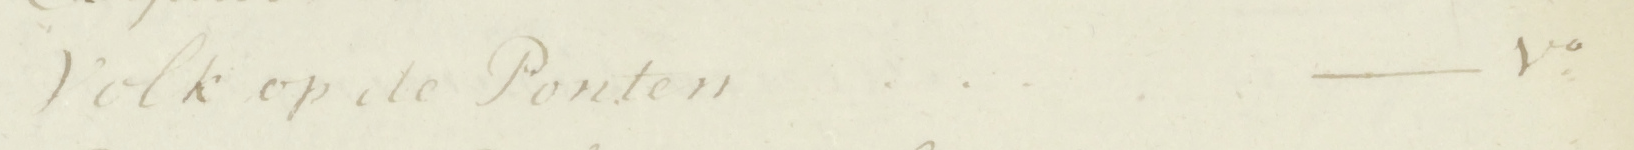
Volk op de Ponten...— Vo.
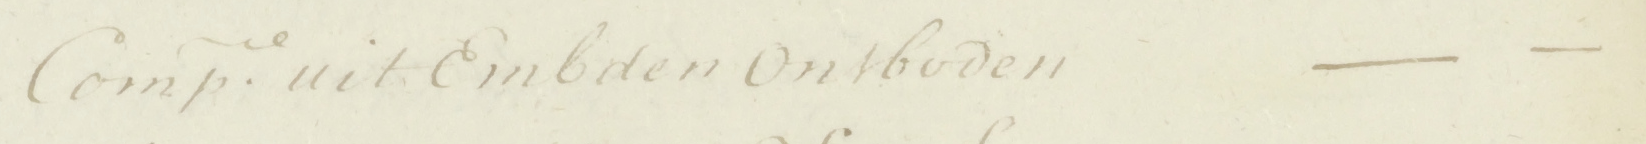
Compe uit Embden ontboden — -
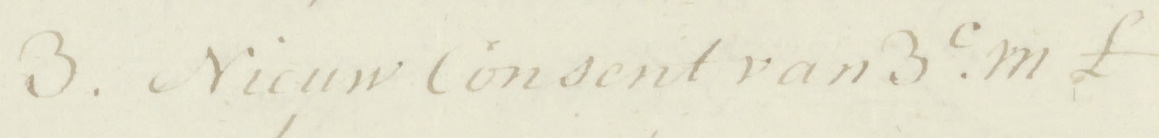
3. Nieuw Consent van 3c. m lb
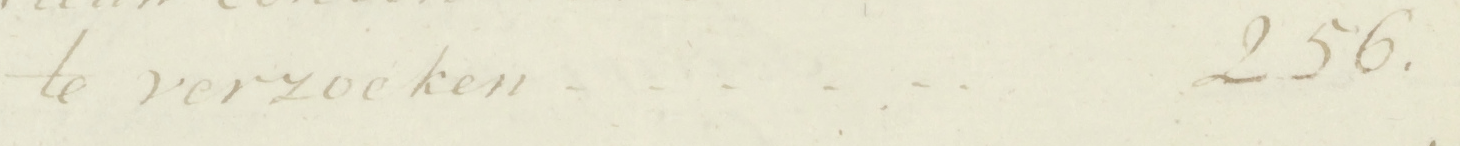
te verzoeken......256.
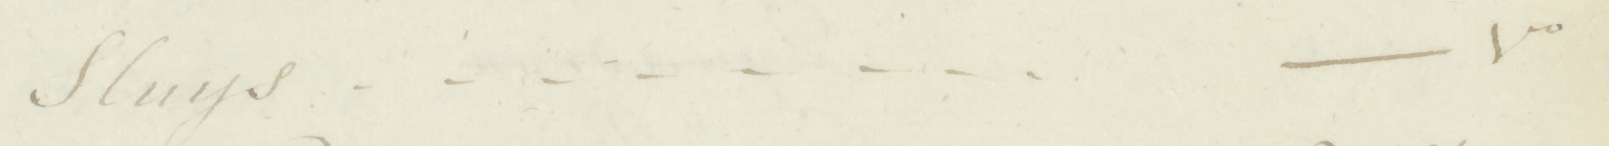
Sluys........— Vo.
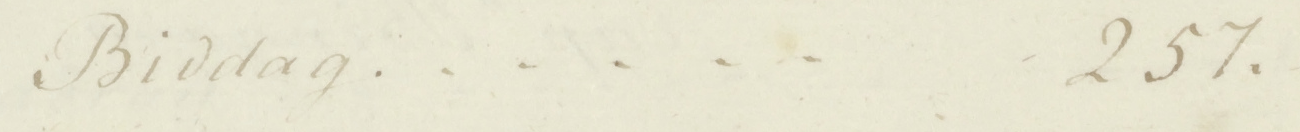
Biddag......257.
